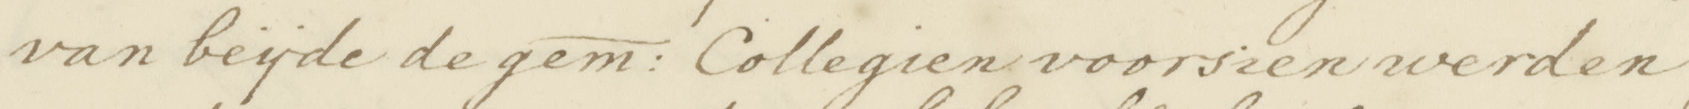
van beijde de gem: Collegien voorsien werden
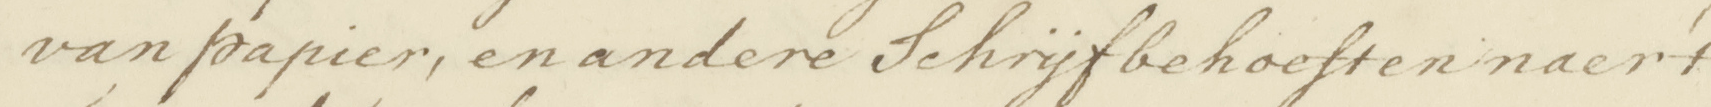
van papier, en andere Schrijfbehoeften naer‛t
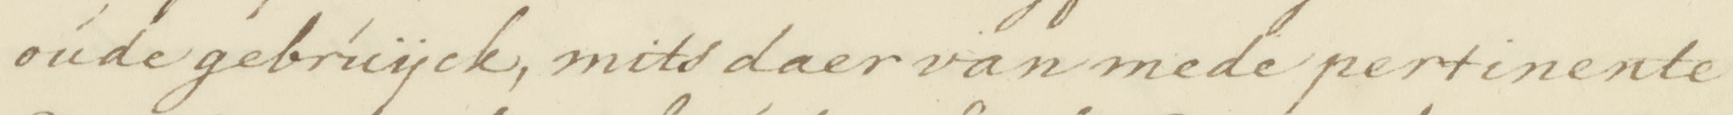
oude gebruijck, mits daer van mede pertinente
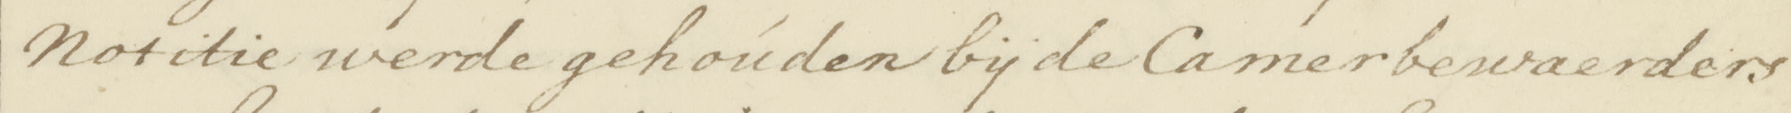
Notitie werde gehouden bij de Camerbewaerders
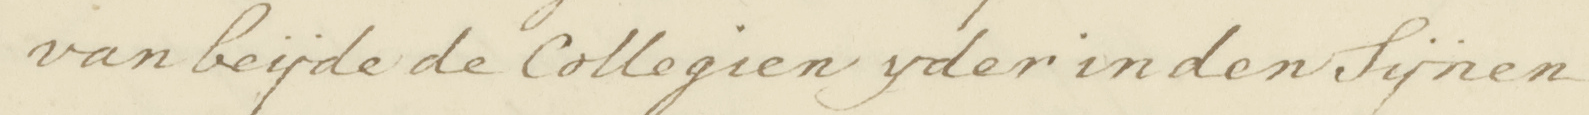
van beijde de Collegien yder inden Sijnen.
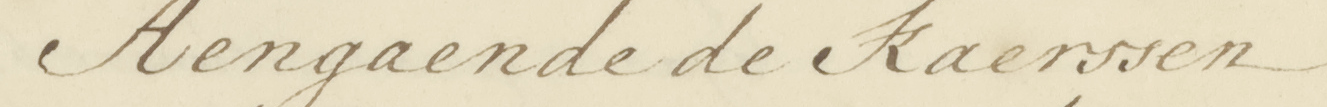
Aengaende de Kaerssen
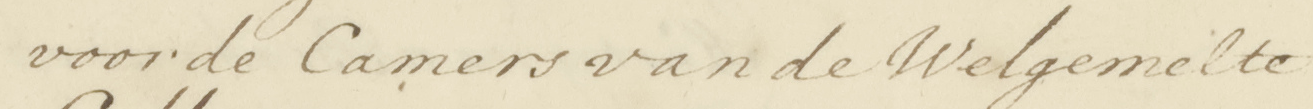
voor de Camers van de Welgemelte
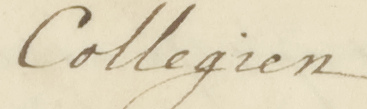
Collegien.
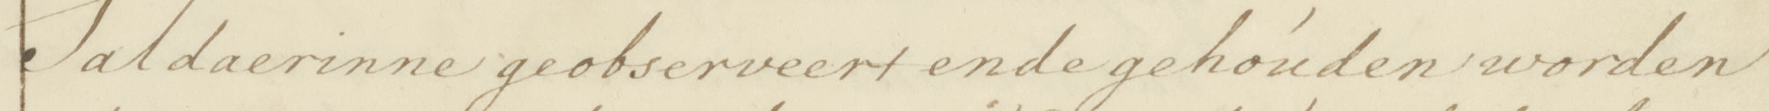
Sal daerinne geobserveert ende gehouden worden
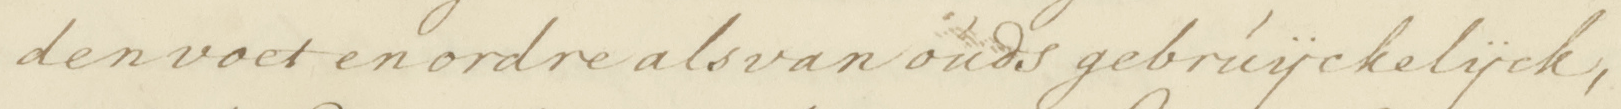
den voet en ordre als van ouds gebruijckelijck,
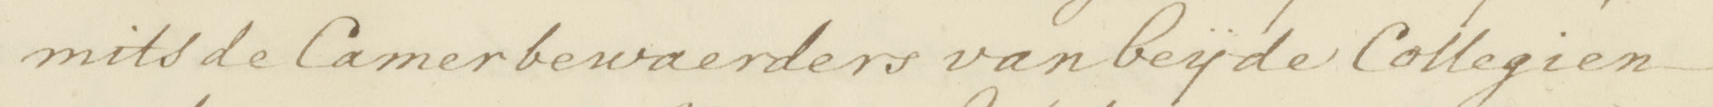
mits de Camerbewaerders van beijde Collegien
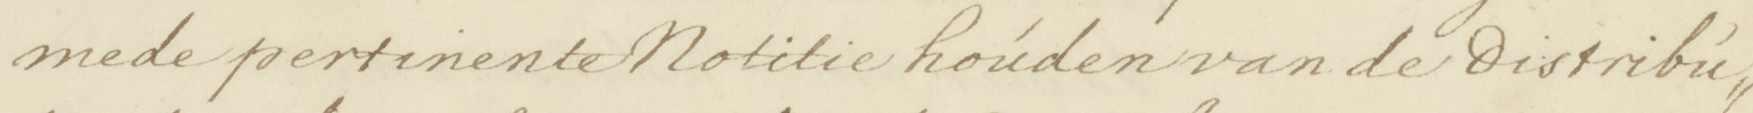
mede pertinente Notitie houden van de distribu„
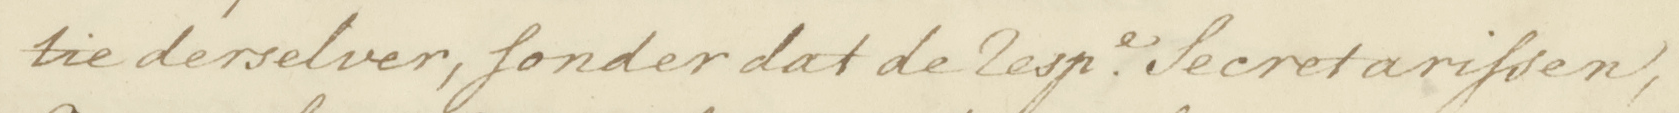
tie derselver, sonder dat de respe. Secretarissen,
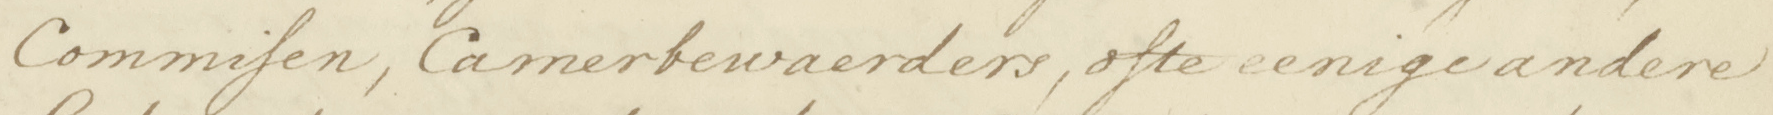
Commisen, Camerbewaerders, ofte eenige andere
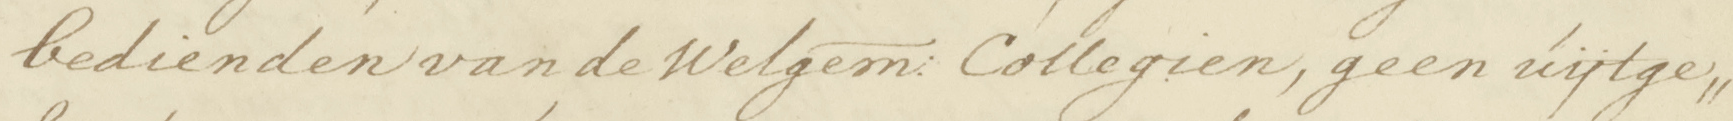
bedienden van de Welgem: Collegien, geen uijtge„
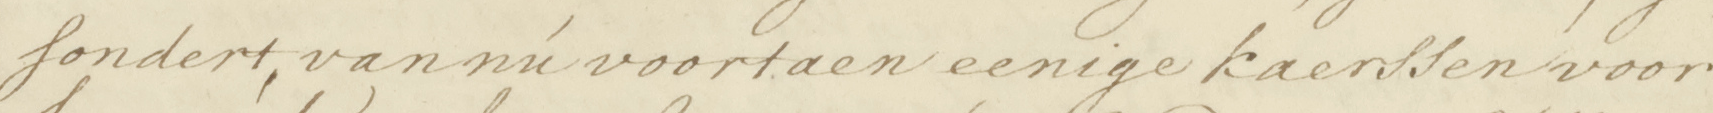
sondert, van nu voortaen eenige kaerssen voor
